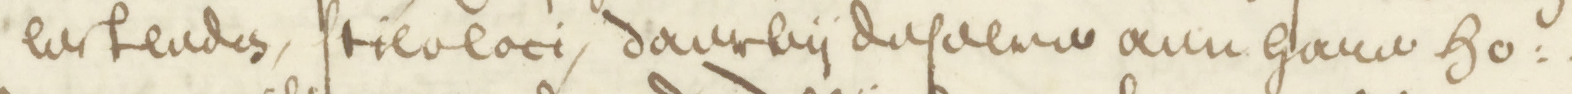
lestleden, stilo loci, daerbij deselve aen hare Ho:
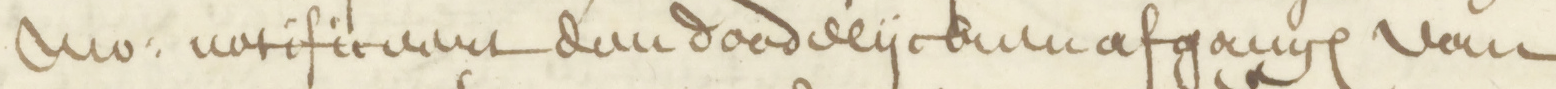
Mo: notificeert den doodelijcken afgangh van
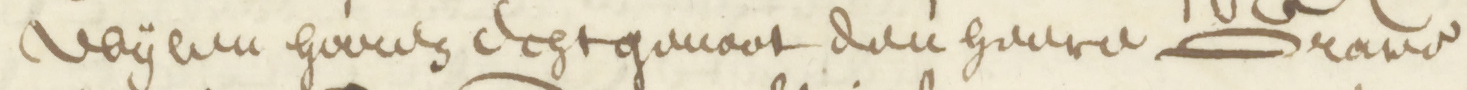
Wijlen haren Echtgenoot den heere Grave
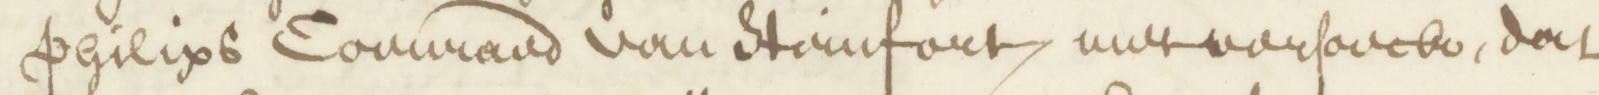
Philips Coenraed van Steinfort, met versoeck, dat
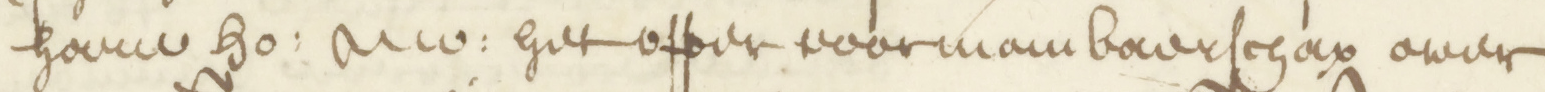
hare Ho:Mo: het opper voormombaerschap over
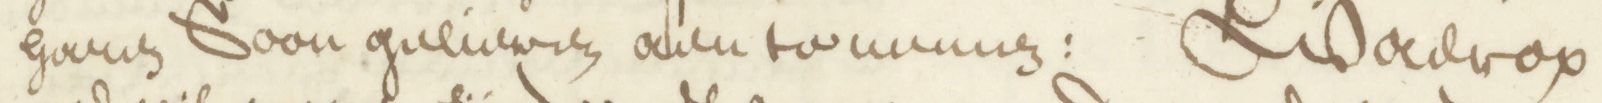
haren Soon gelieven aen te nemen: Waerop
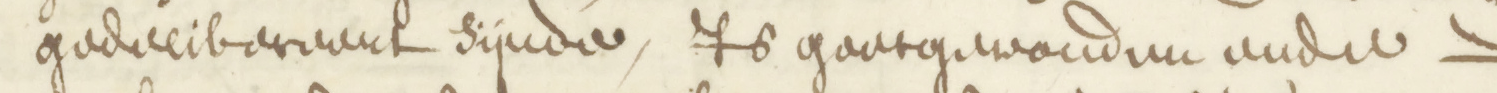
gedelibereert sijnde, Is goetgevonden ende —
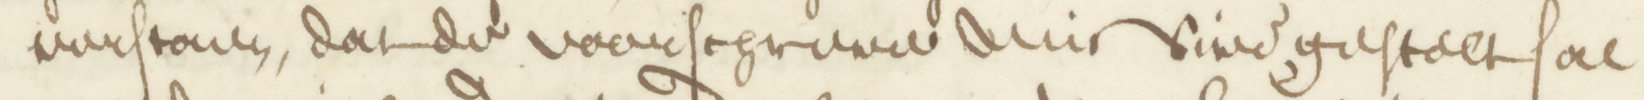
verstaen, dat de voorschreve Missive gestelt sal
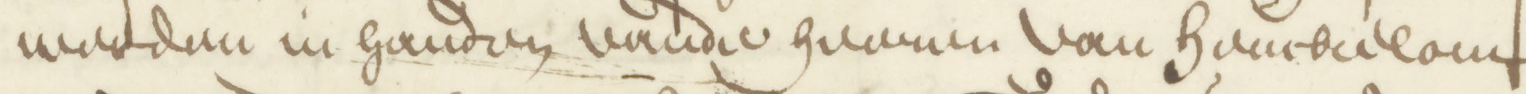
werden in handen vande heeren van Heuckelom,
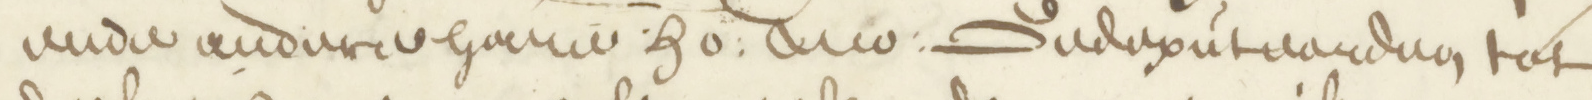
ende andere hare Ho:Mo: Gedeputeerden tot
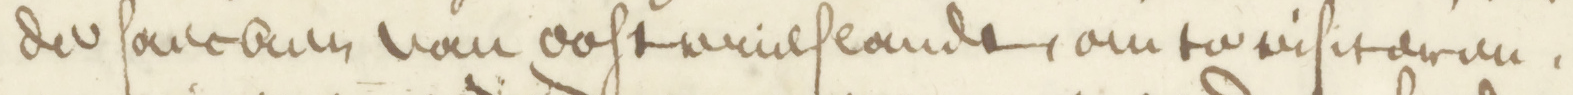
de saecken van oostvrieslandt, om te visiteren,
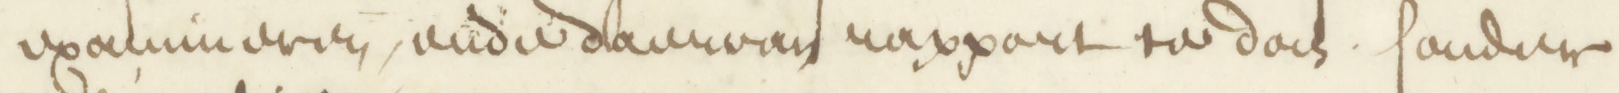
examineren, ende daervan rapport te doen. sonder
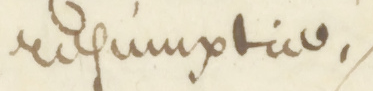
resumptie.
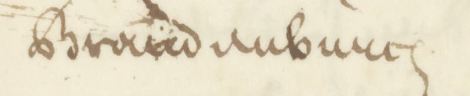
Brandenburch
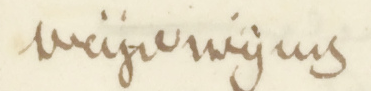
vrije wijnen
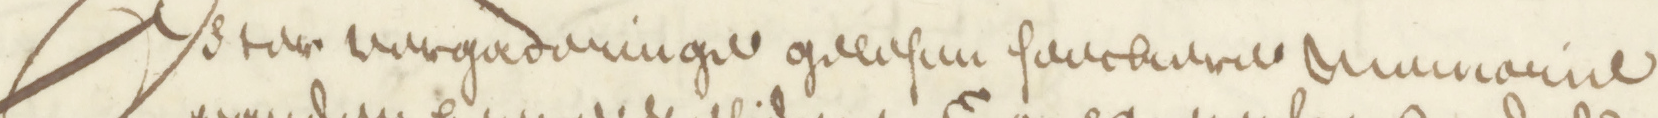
Is ter vergaderinge gelesen seeckere Memorie
